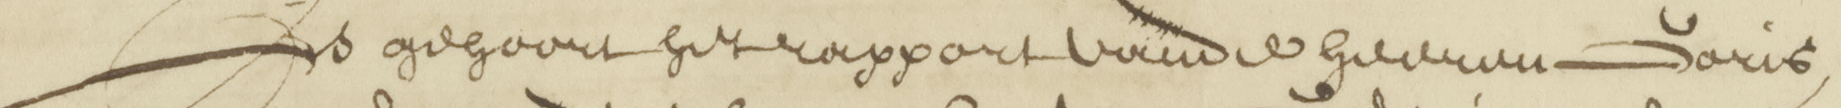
Is gehoort het rapport vande heeren Goris
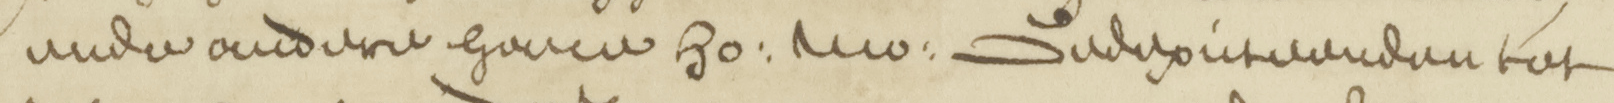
ende andere hare Ho:Mo: Gedeputeerden tot
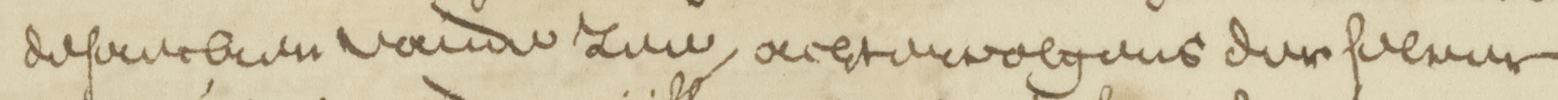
desaecken vande Zee, achtervolgens der selver
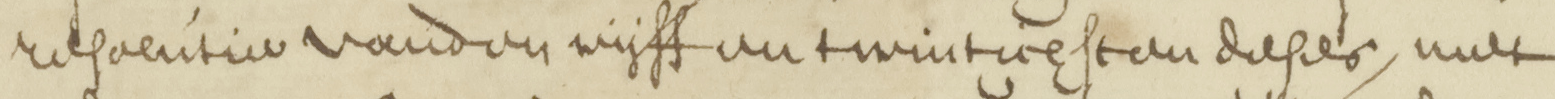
resolutie vanden vijff en twintichsten deses, met
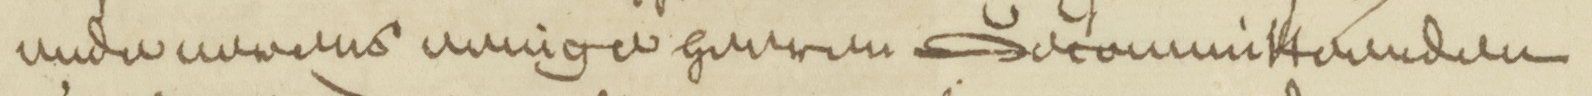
ende nevens eenige heeren Gecommitteerden
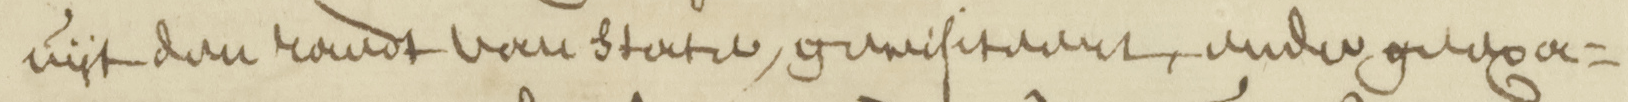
uijt den raedt van State, gevisiteert, ende geexa„
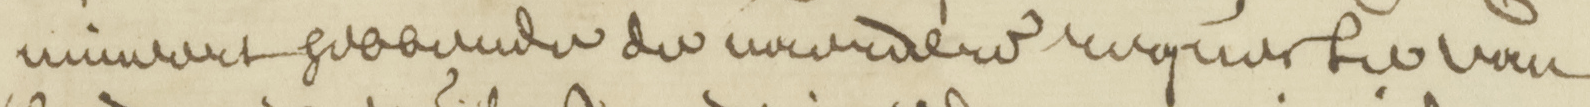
mineert hebbende de naerdere requeste van
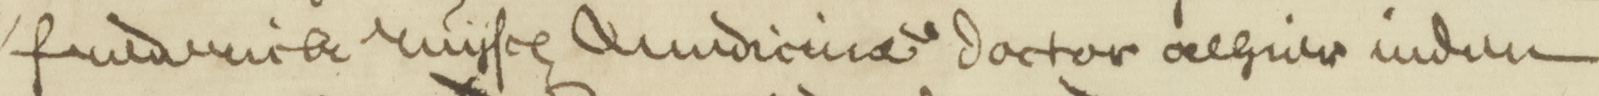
Frederick ruijsch Medicinae doctor alhier inden
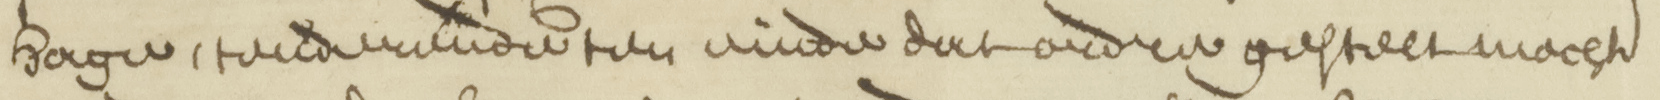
Hage, tenderende ten einde dat ordre gestelt mochte
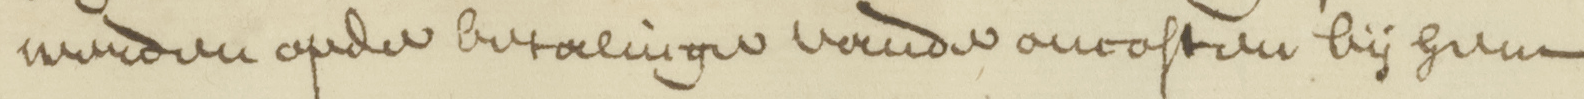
werden opde betalinge vande oncosten bij hem
